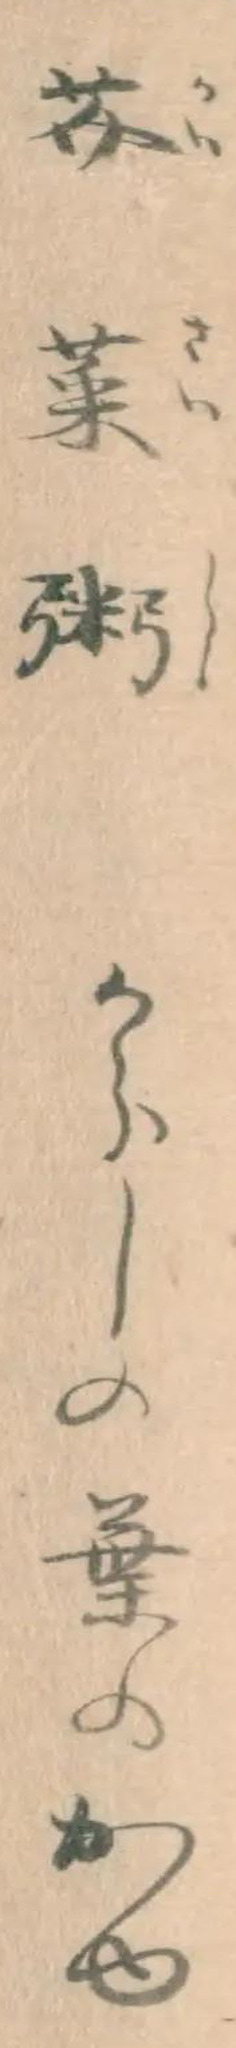芥菜粥からしの葉のかゆ
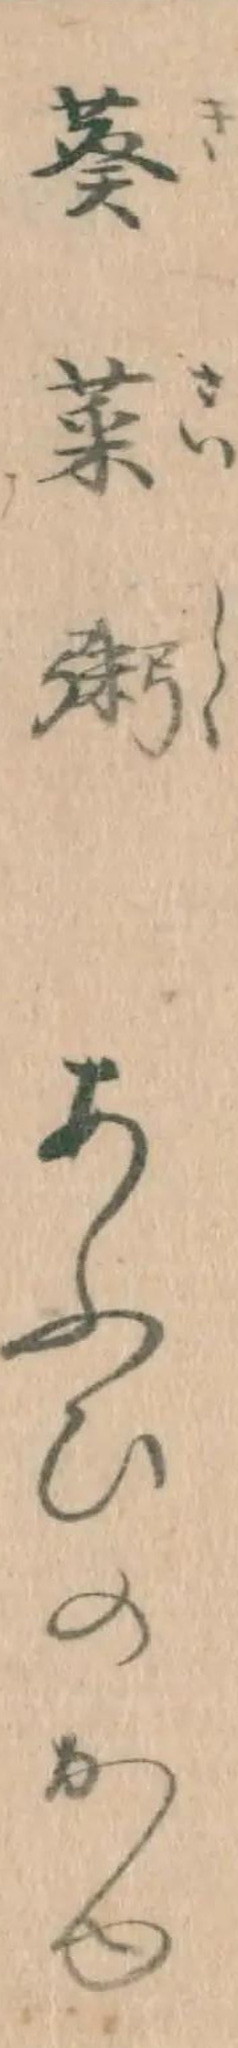葵菜粥あふひのかゆ
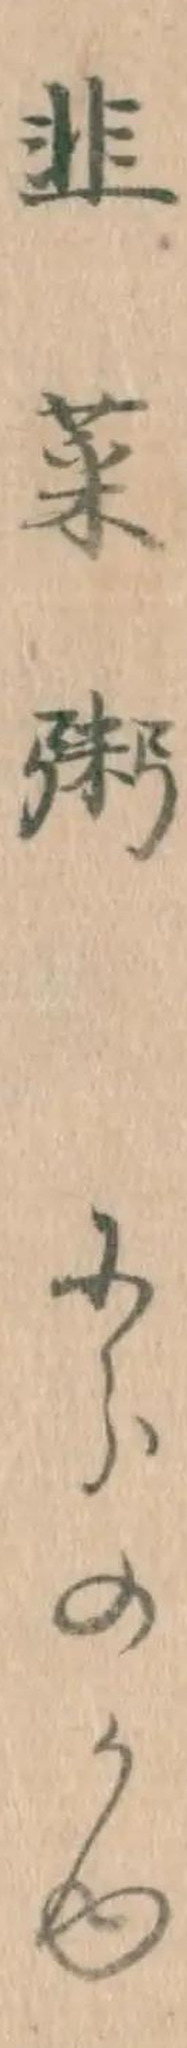韭菜粥にらのかゆ
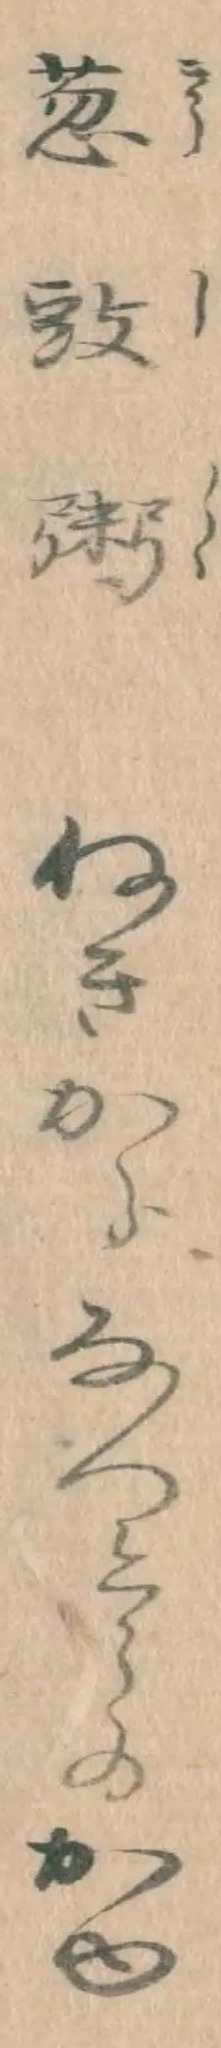葱豉粥ねきからなつとうのかゆ
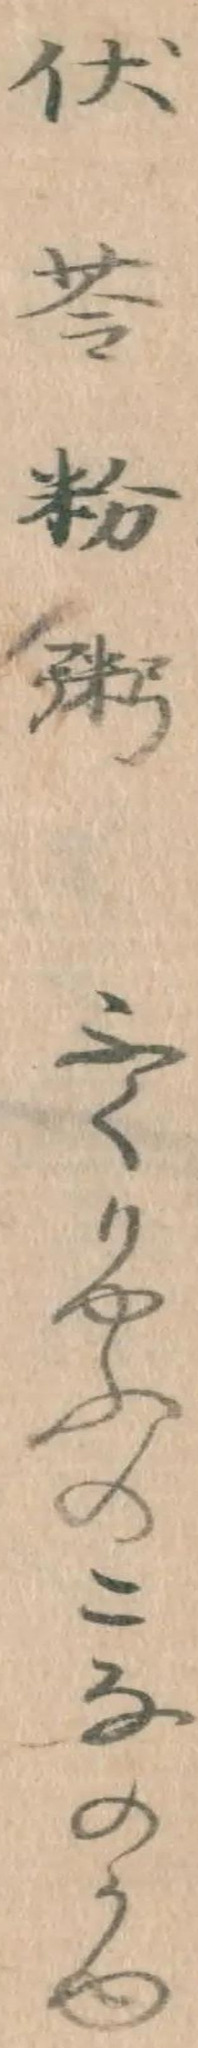伏苓粉粥ふくりゆふのこなのかゆ
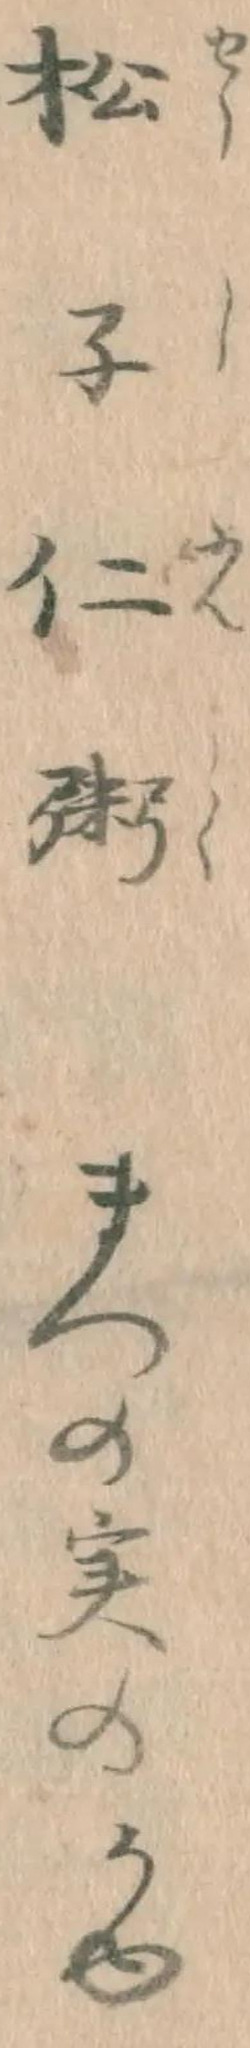松子仁粥まつの実のかゆ
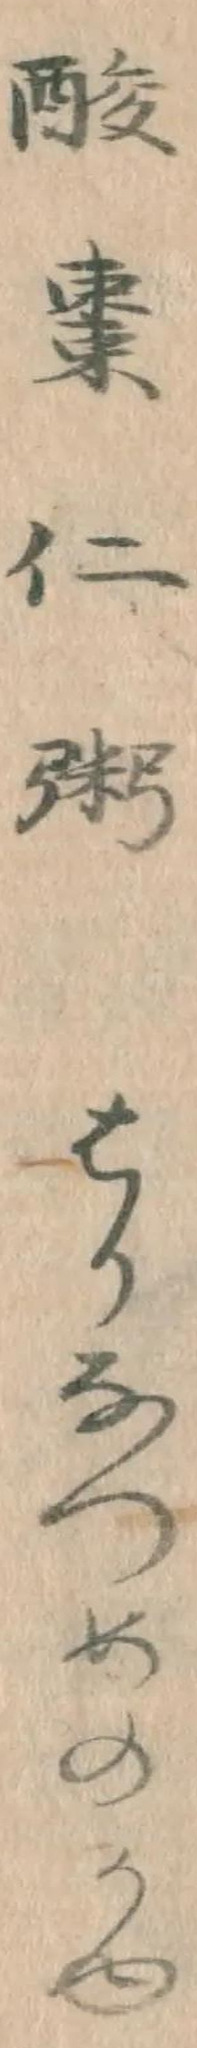酸棗仁粥はりなつめのかゆ
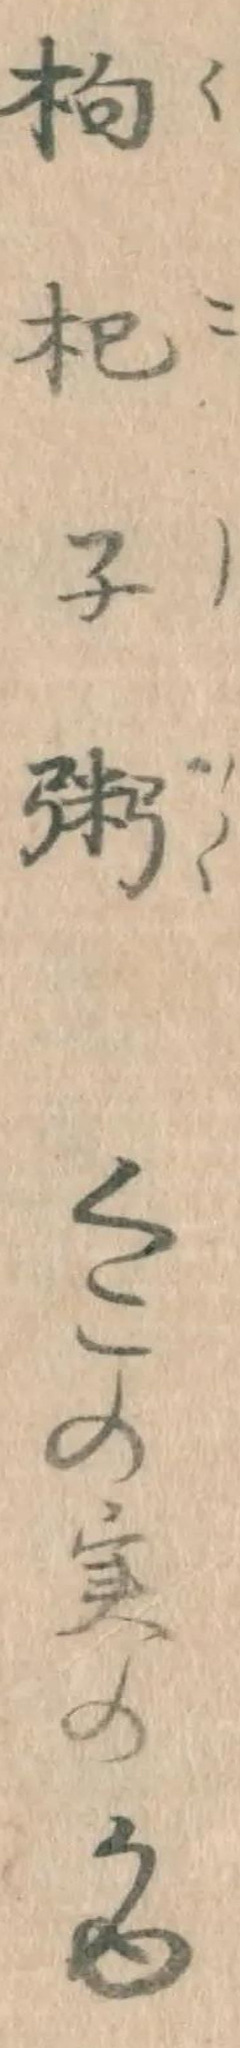枸杞子粥くこの実のかゆ
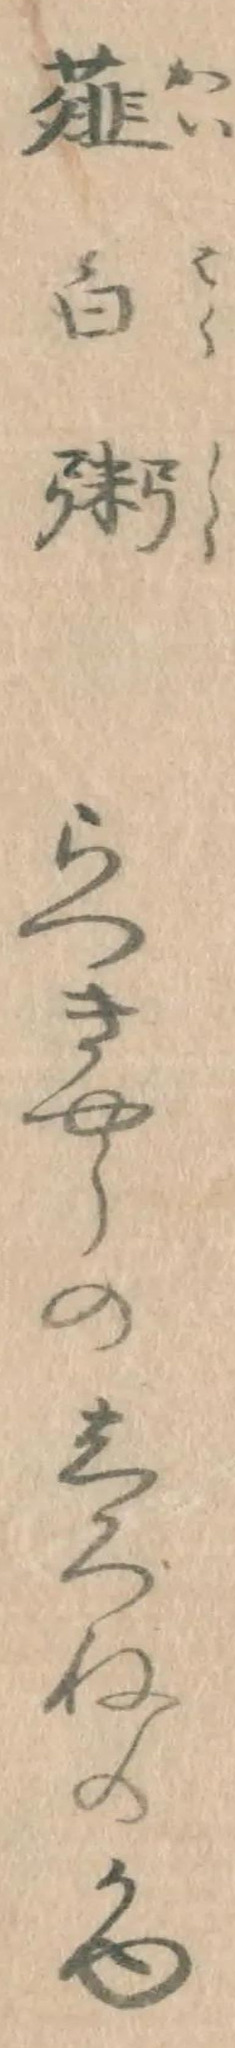薤白粥らつきやうのしろねのかゆ
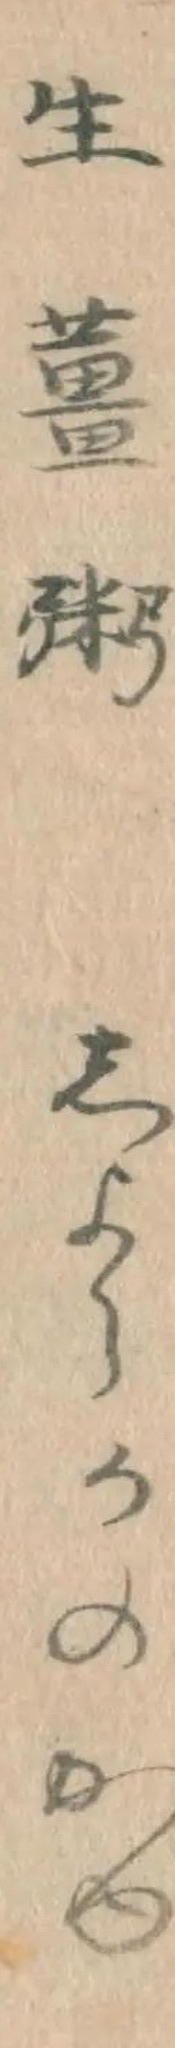生薑粥しようかのかゆ

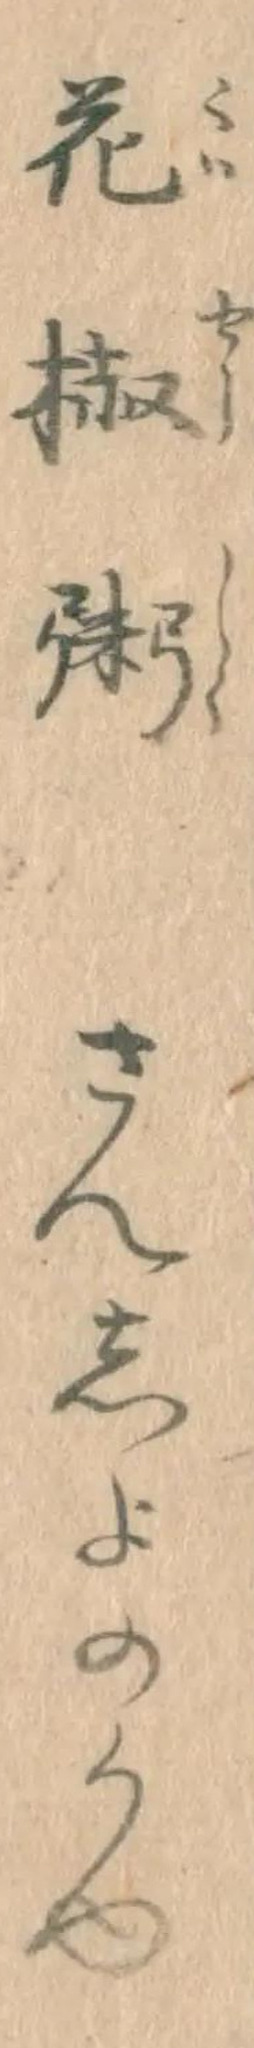花椒粥さんしよのかゆ
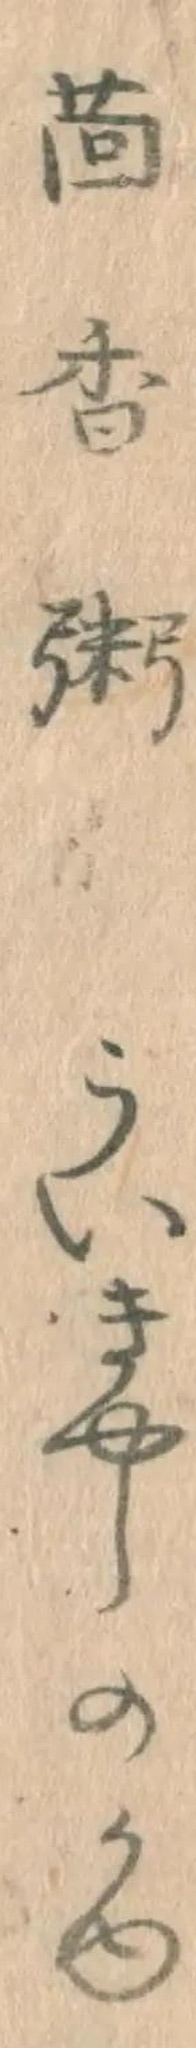茴香粥ういきやうのかゆ
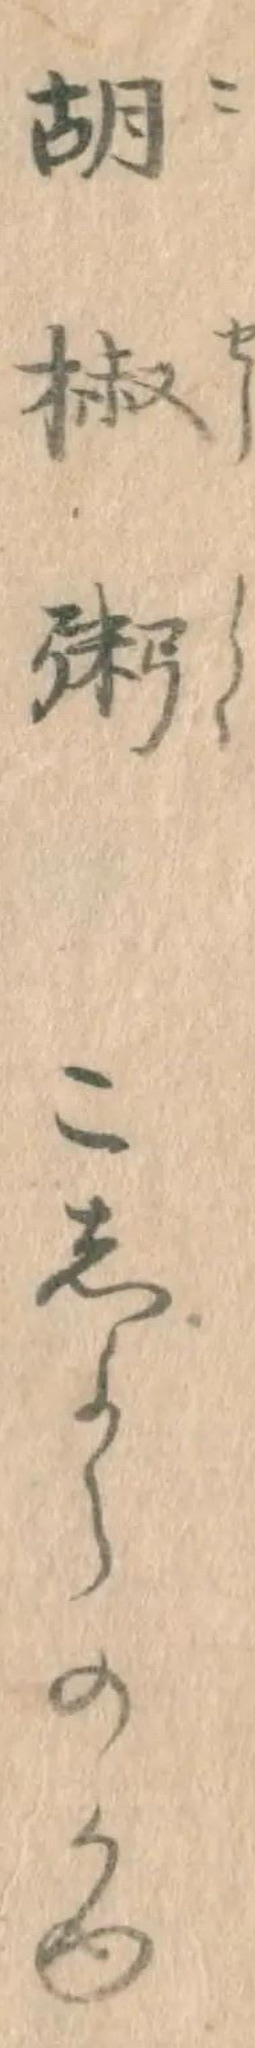胡椒粥こしようのかゆ
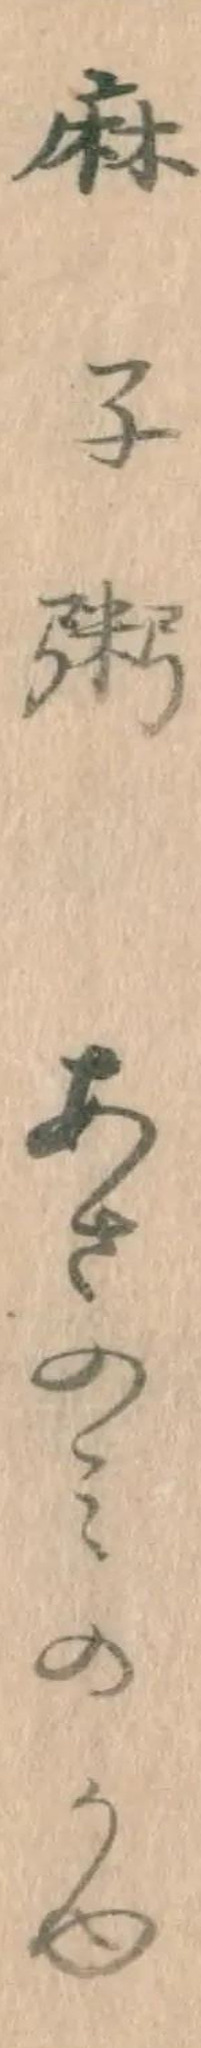麻子粥あさのみのかゆ
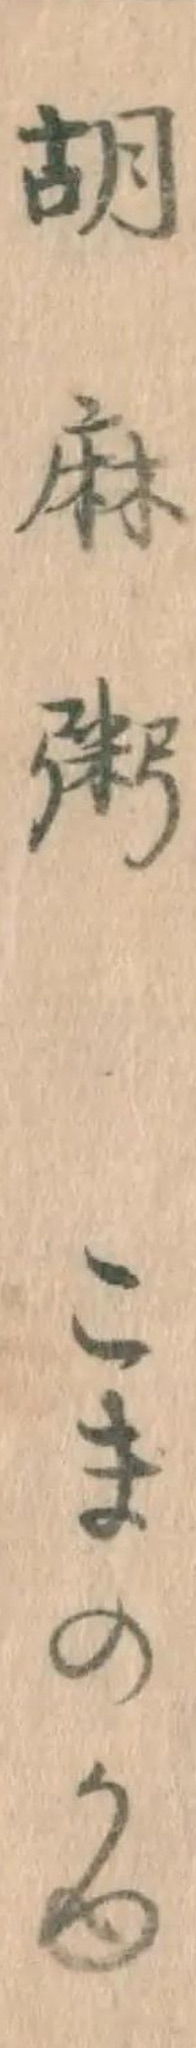胡麻粥こまのかゆ
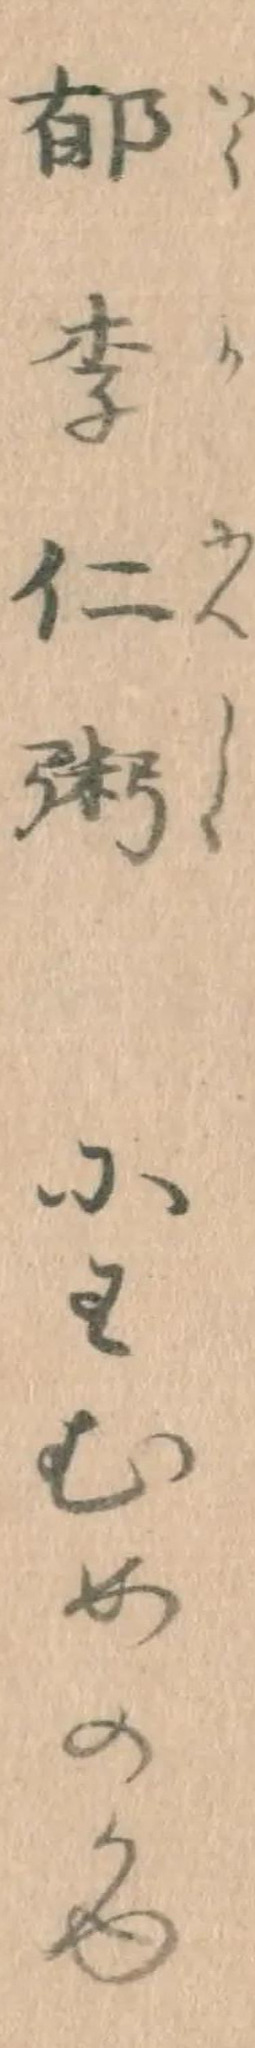郁李仁粥にわむめのかゆ
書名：本草図譜. 巻43-45
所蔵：国立国会図書館 National Diet Library, JAPAN
